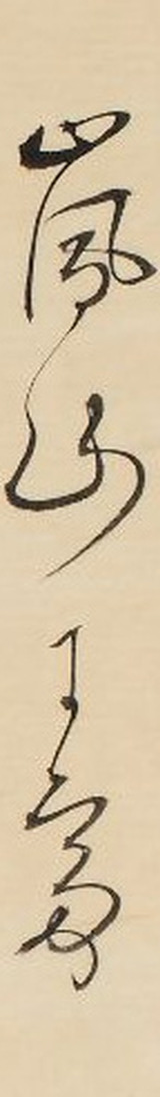嵐山にて
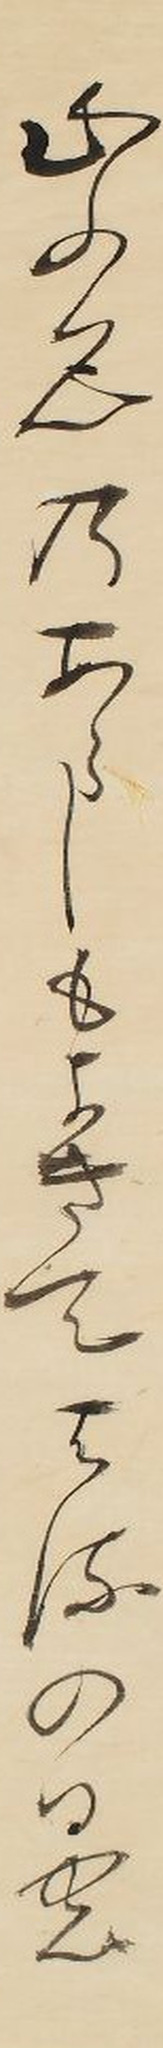山の名のあらしもよきてはるの日の
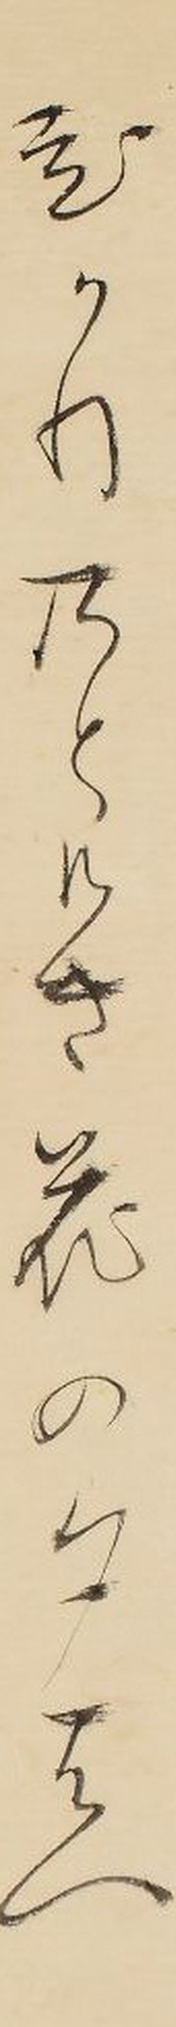ひかりのとけき花の夕はえ
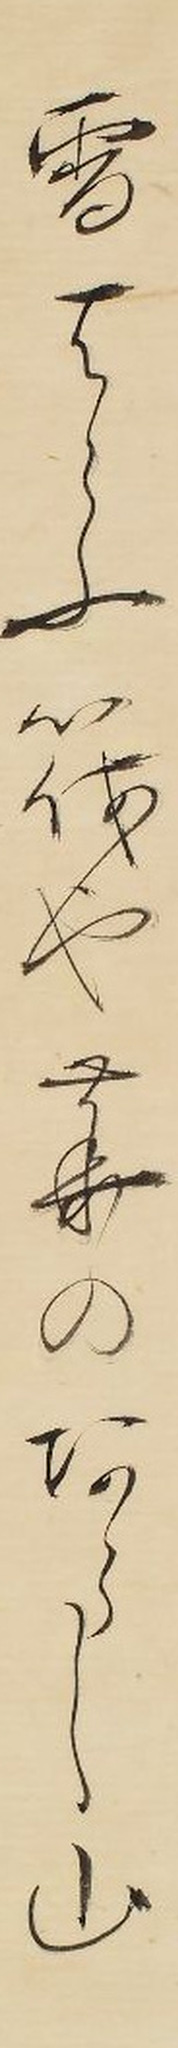雪はらふ筏や華のあらし山
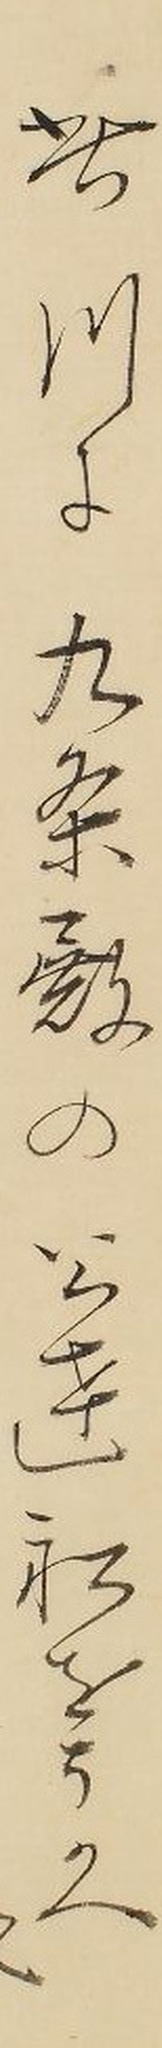此川に九条殿の公達船をうかへて
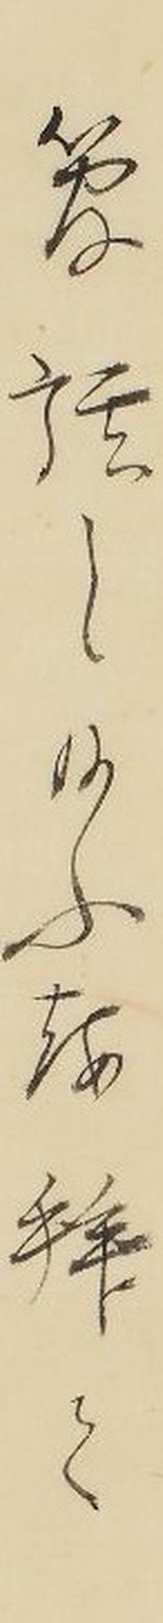管弦し給ふを拜て
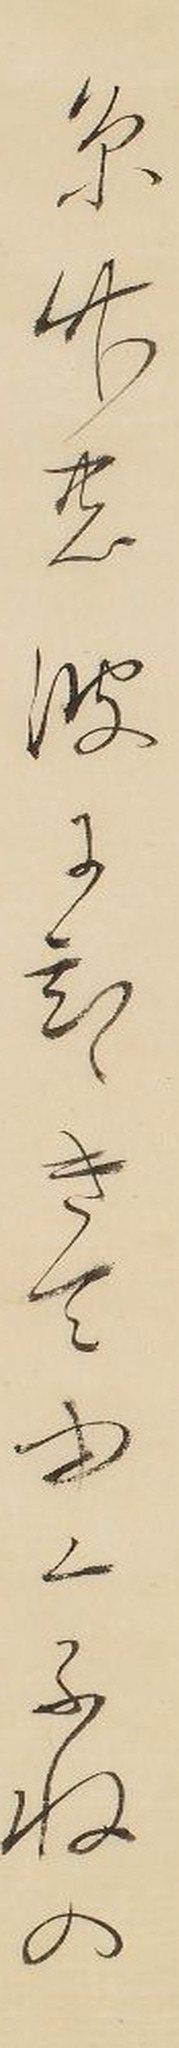糸竹の波にひゝきてゆくふねの
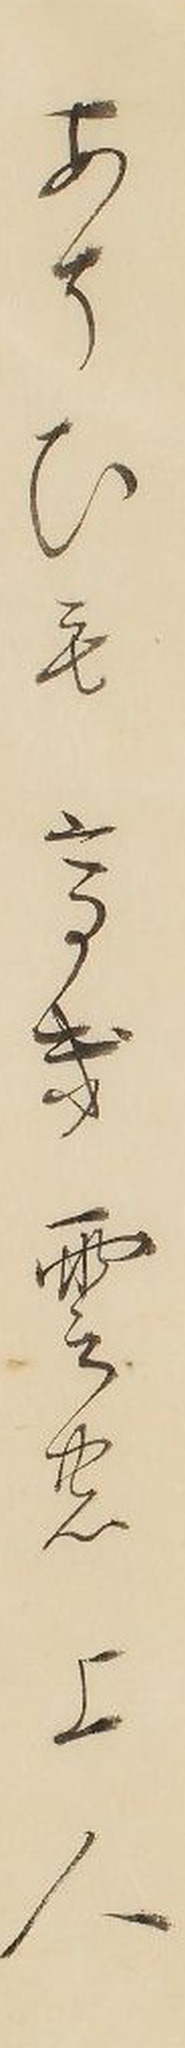あそひも高き雲の上人
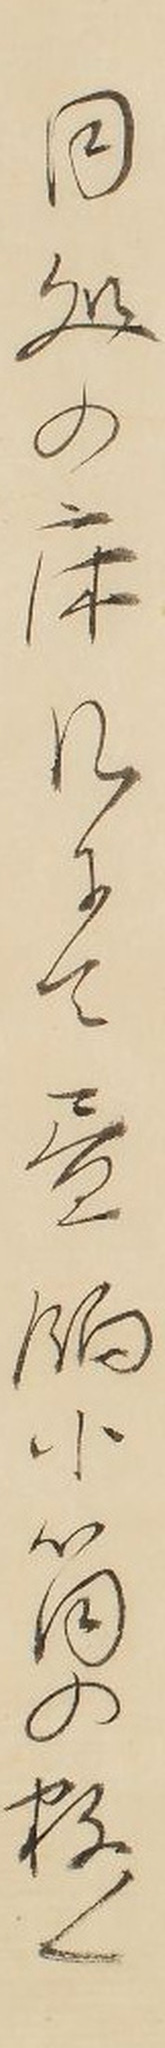同処の床几にて昼餉小筒の数〳〵
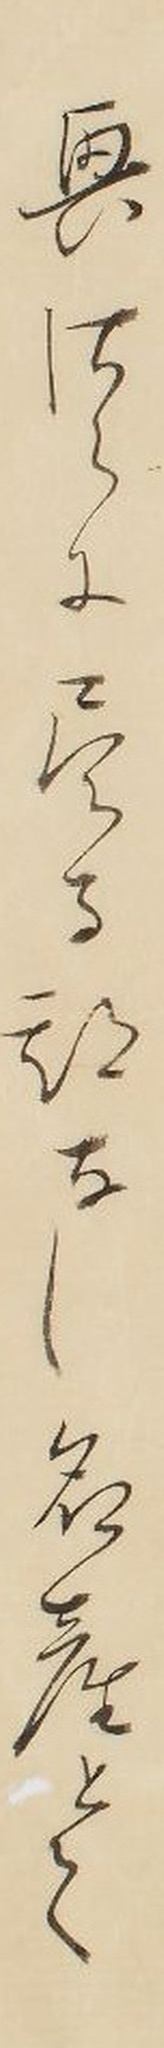興さらに尽る期なし名産とて
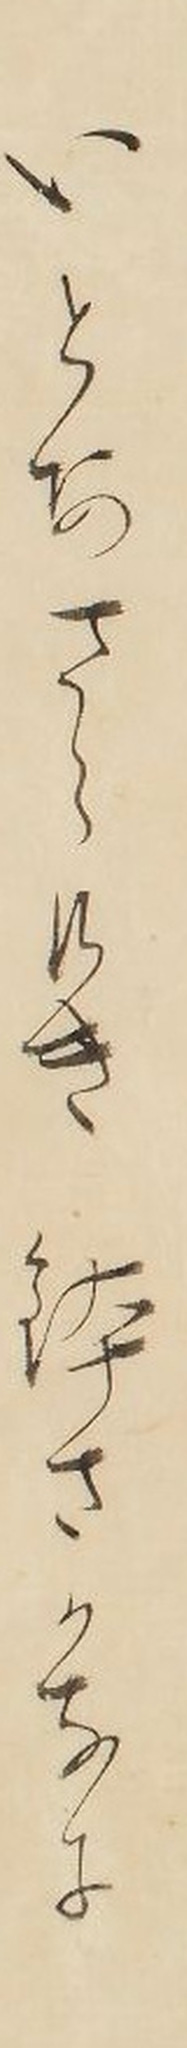いとあさらけき鉢さかなに
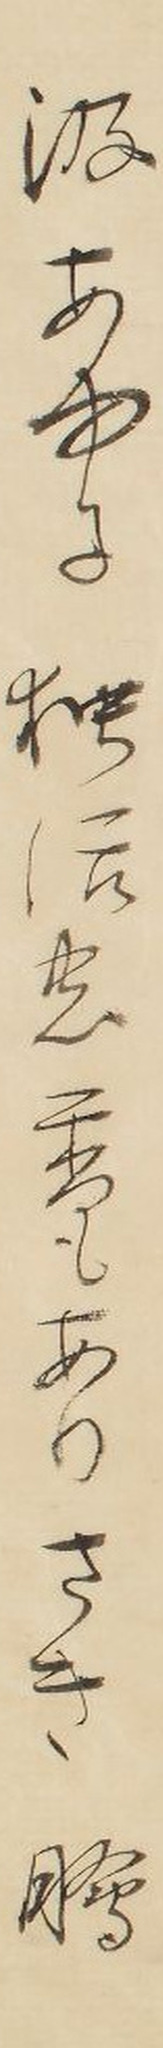汲あゆに独活の香もありさき膾
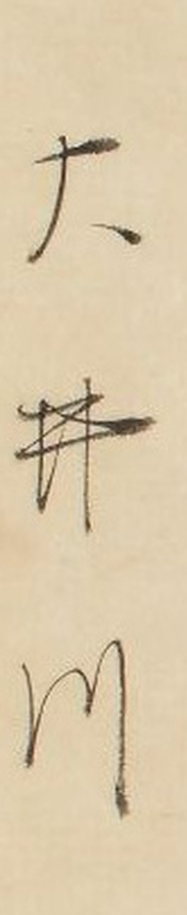大井川

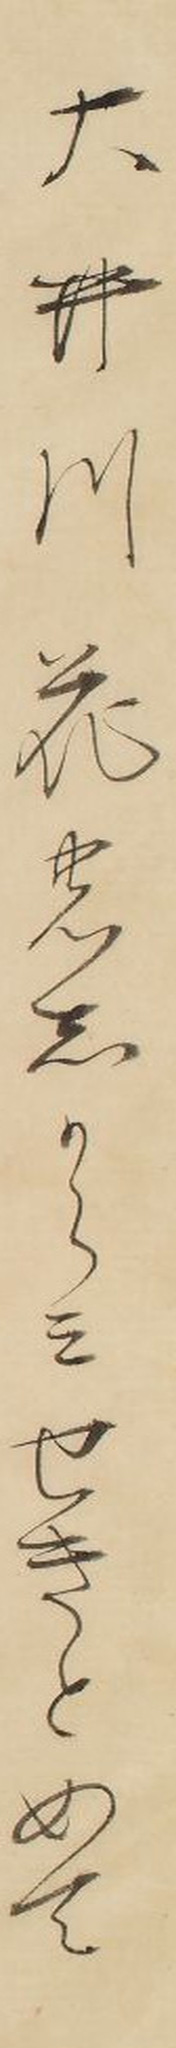大井川花のしからみせきとめて
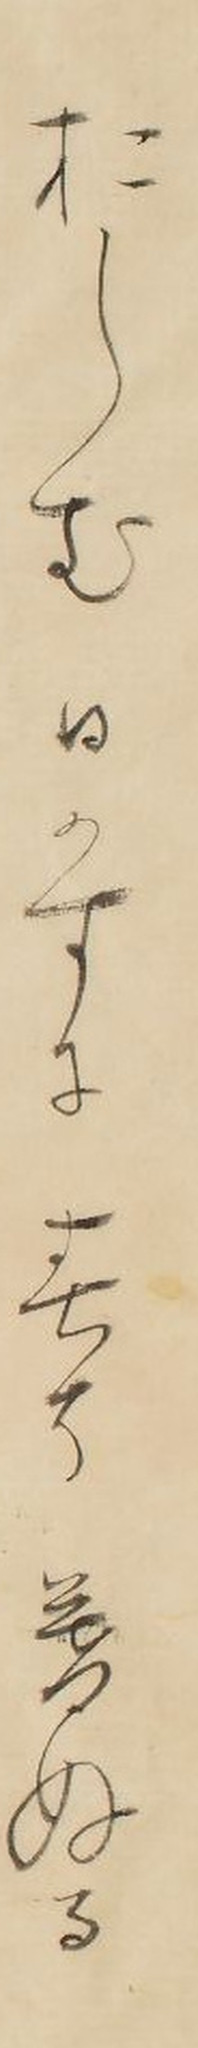おしむ日かすに春そ暮ぬる
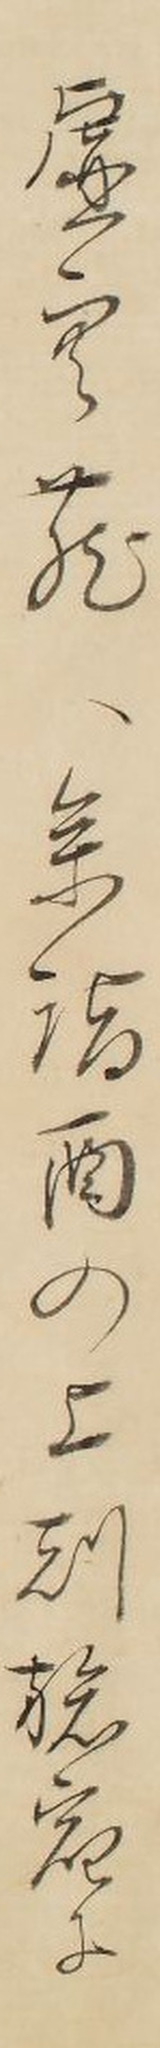虚空蔵へ参詣酉の上刻旅宿に
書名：花土産
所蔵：徳島県立図書館
